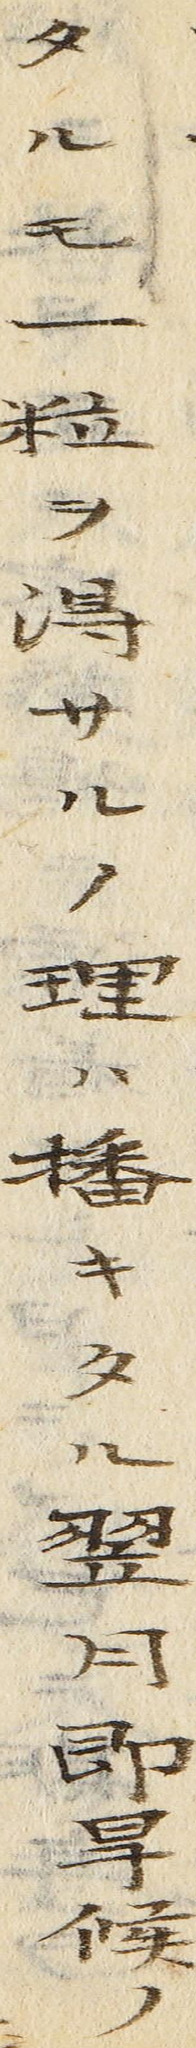タルモ一粒ヲ得サルノ理ハ播キタル翌月即旱候ノ
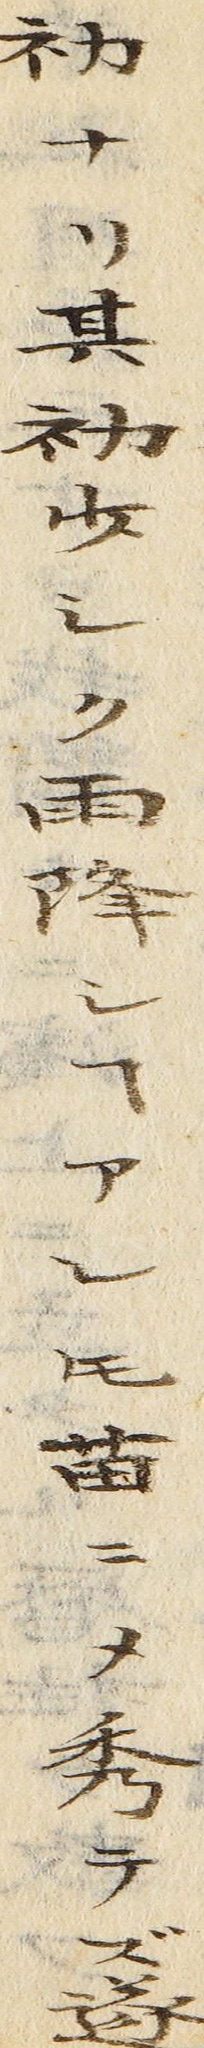初ナリ其初少シク雨降シコトアレトモ苗ニシテ秀テズ遂
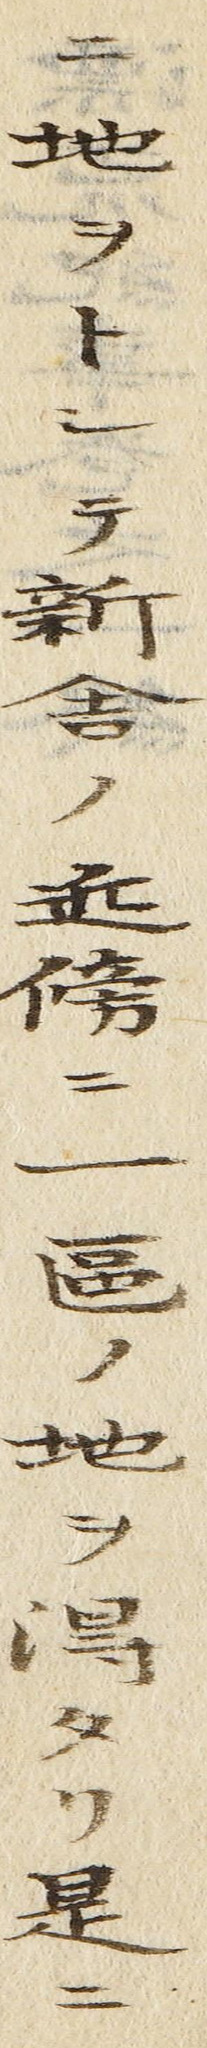ニ地ヲトシテ新舎ノ近傍ニ一区ノ地ヲ得タリ是ニ
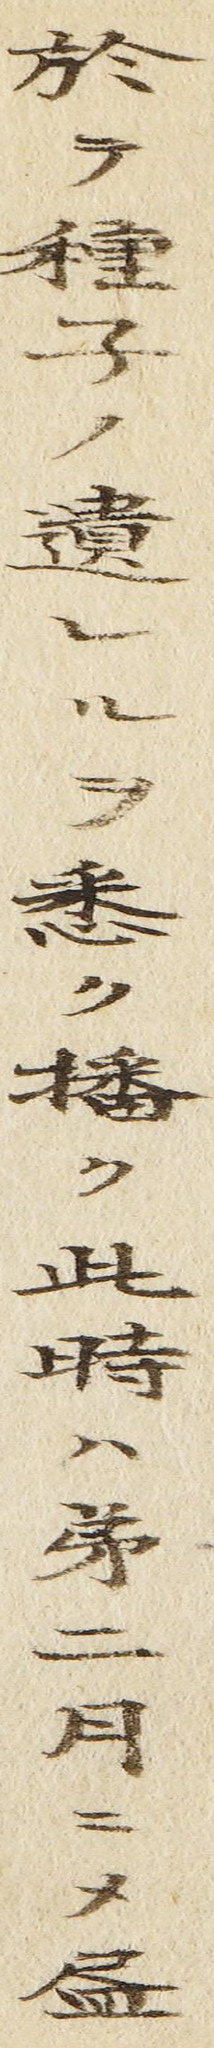於テ種子ノ遺レルヲ悉ク播ク此時ハ第二月ニシテ昼
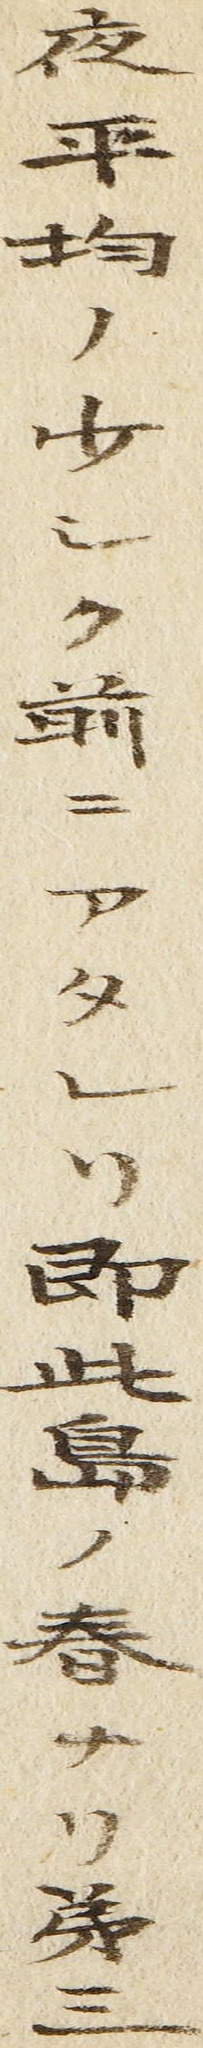夜平均ノ少シク前ニアタレリ即此島ノ春ナリ第三
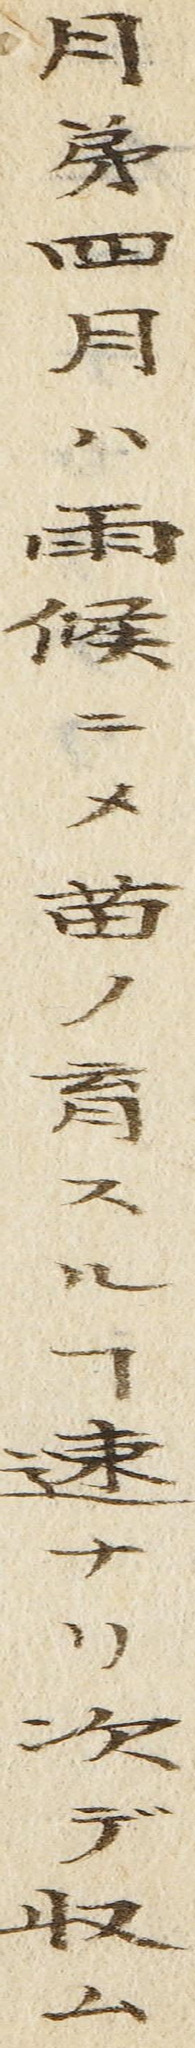月第四月ハ雨候ニシテ苗ノ育スルコト速ナリ次デ収ム
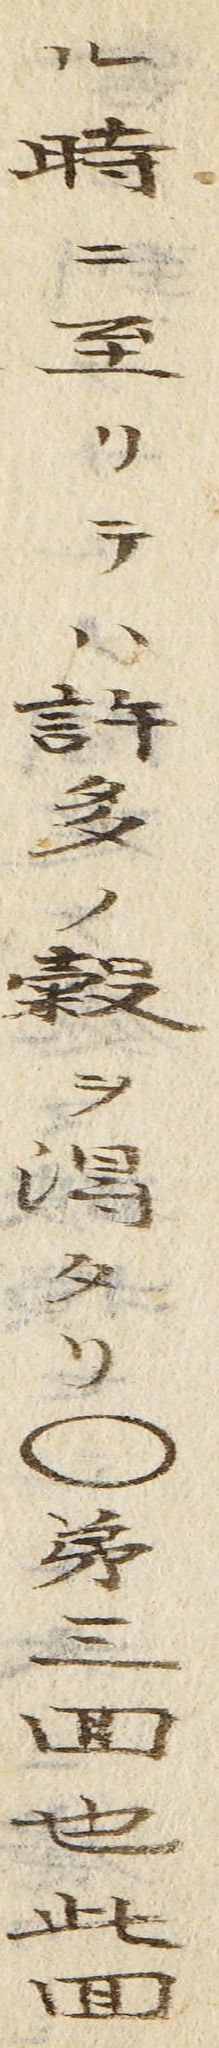ル時ニ至リテハ許多ノ穀ヲ得タリ◯第三回也此回
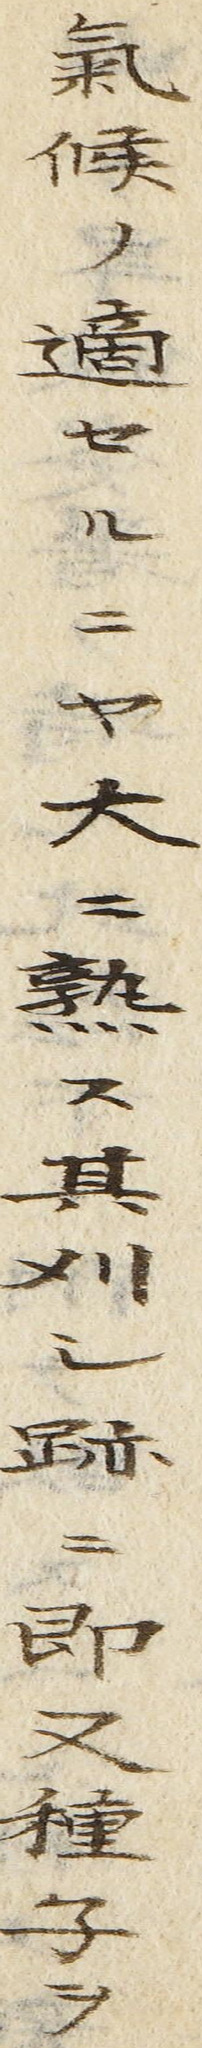気候ノ適セルニヤ大ニ熟ス其刈シ跡ニ即又種子ヲ
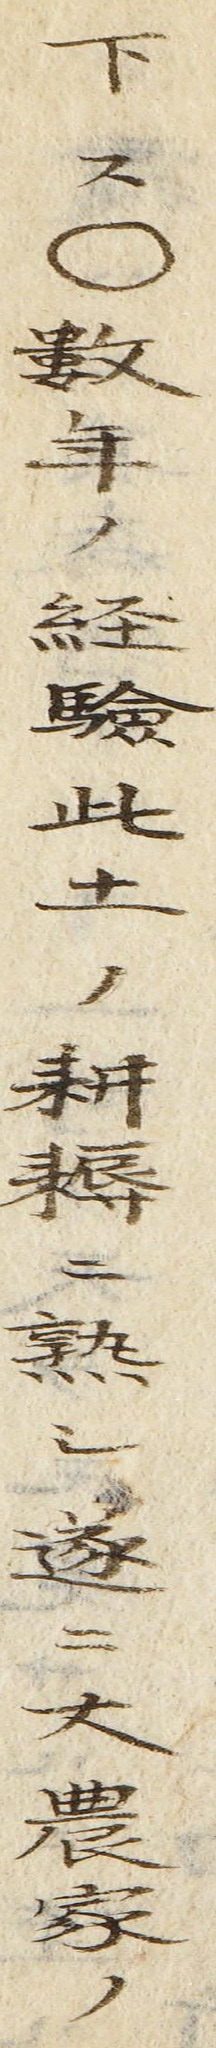下ス◯数年ノ経験此土ノ耕耨ニ熟シ遂ニ大農家ノ
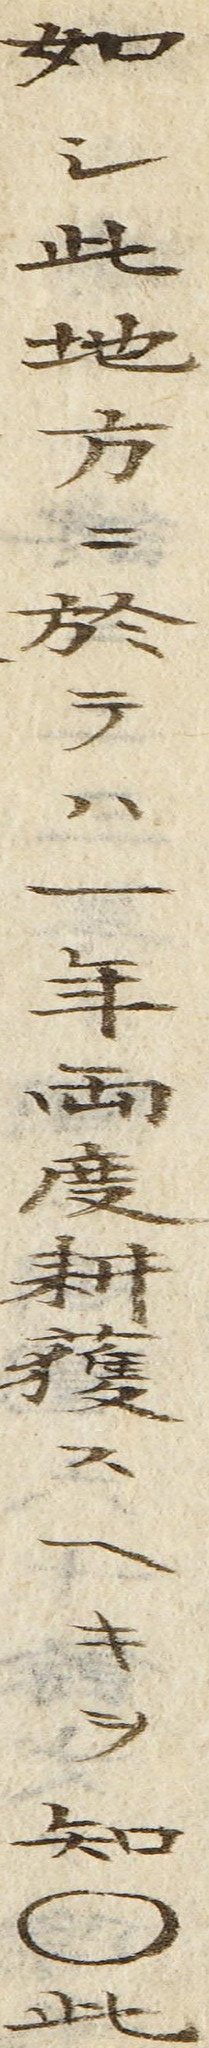如シ此地方ニ於テハ一年両度耕獲スヘキヲ知◯此
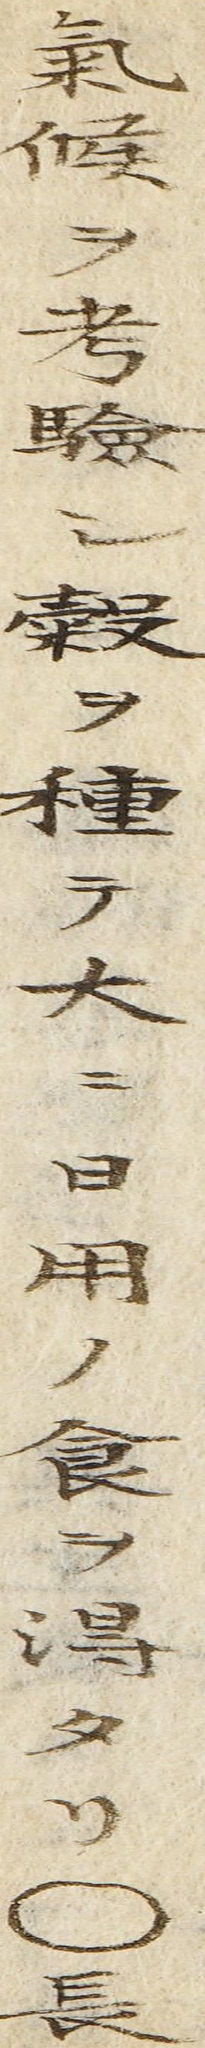気候ヲ考験シ穀ヲ種テ大ニ日用ノ食ヲ得タリ◯長
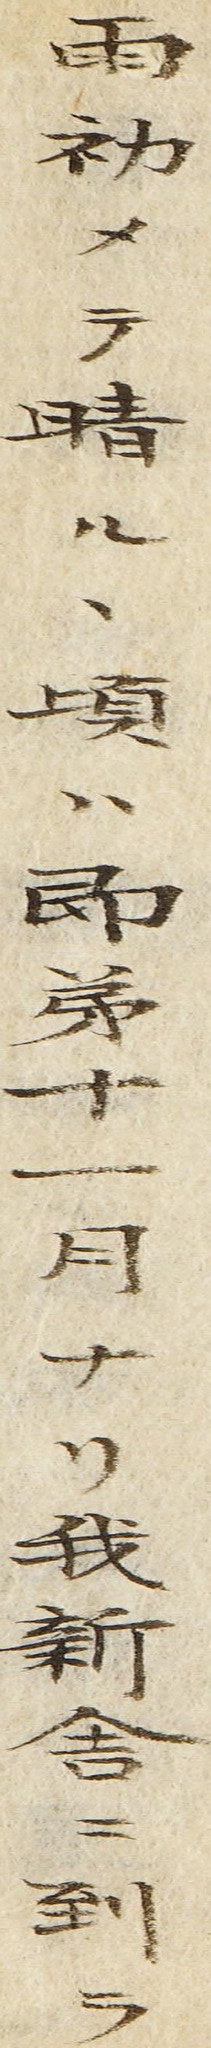雨初メテ晴ルヽ頃ハ即第十一月ナリ我新舎ニ到ラ
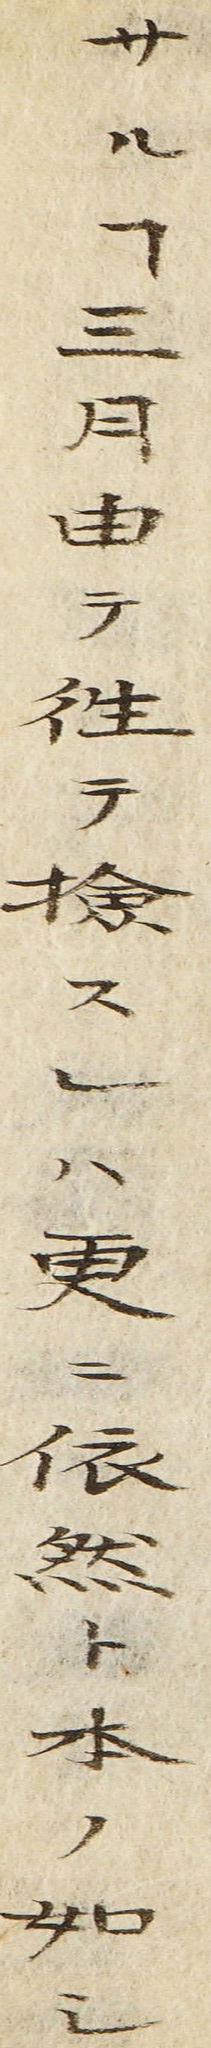サルコト三月由テ往テ撿スレハ更ニ依然ト本ノ如シ

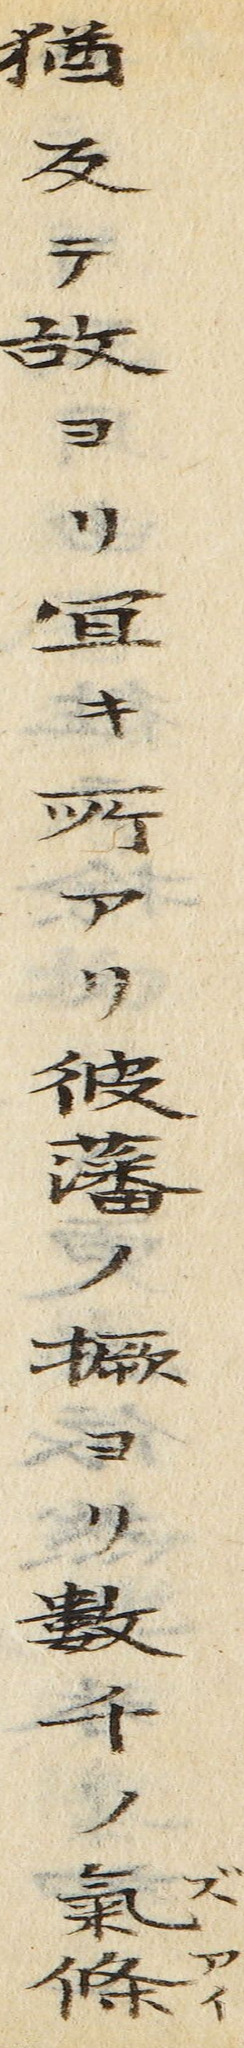猶反テ故ヨリ宜キ所アリ彼藩ノ橛ヨリ数千ノ気條
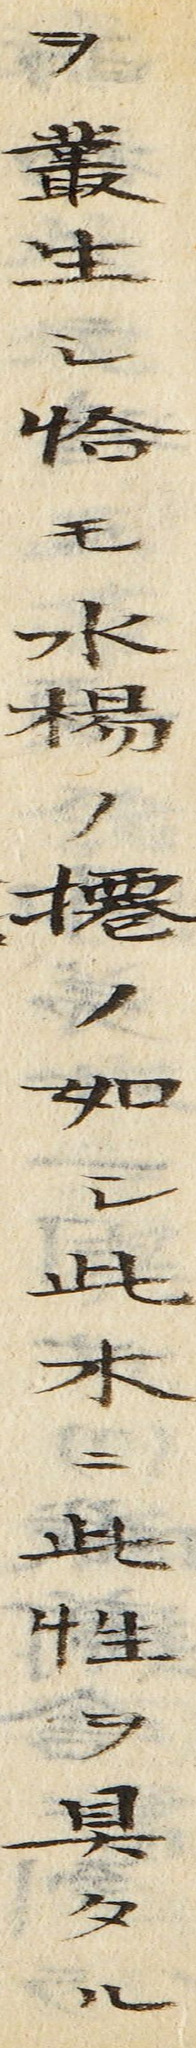ヲ叢生シ拾モ水楊ノ𢳍ノ如シ此木ニ此性ヲ具タル
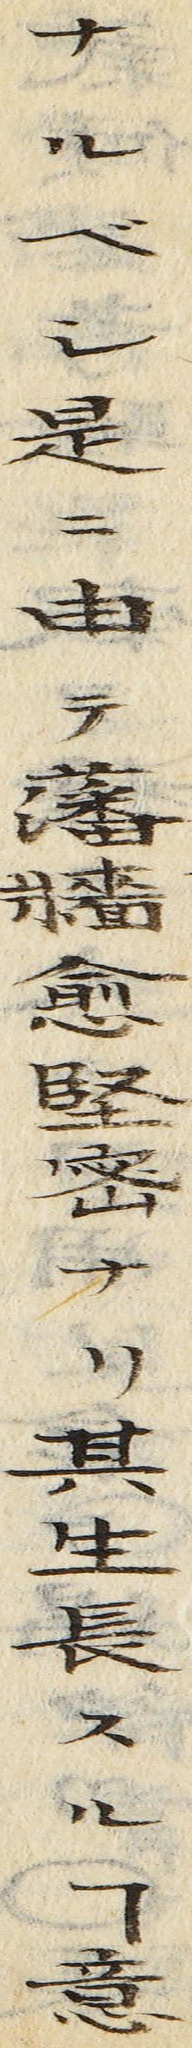ナルベシ是ニ由テ藩牆愈堅密ナリ其生長スルコト意
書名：漂流紀事
